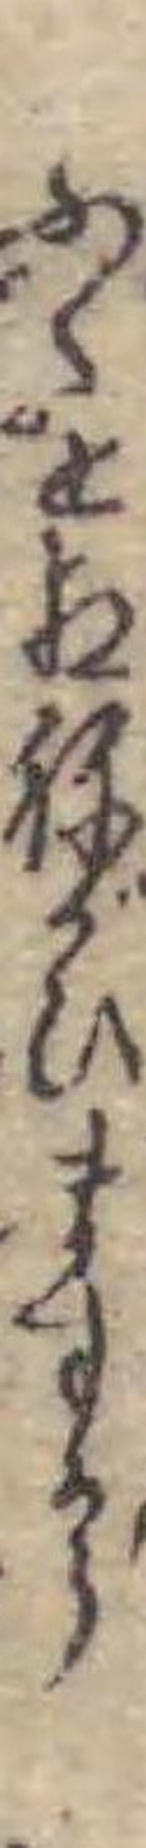ふくを相ねがひますから
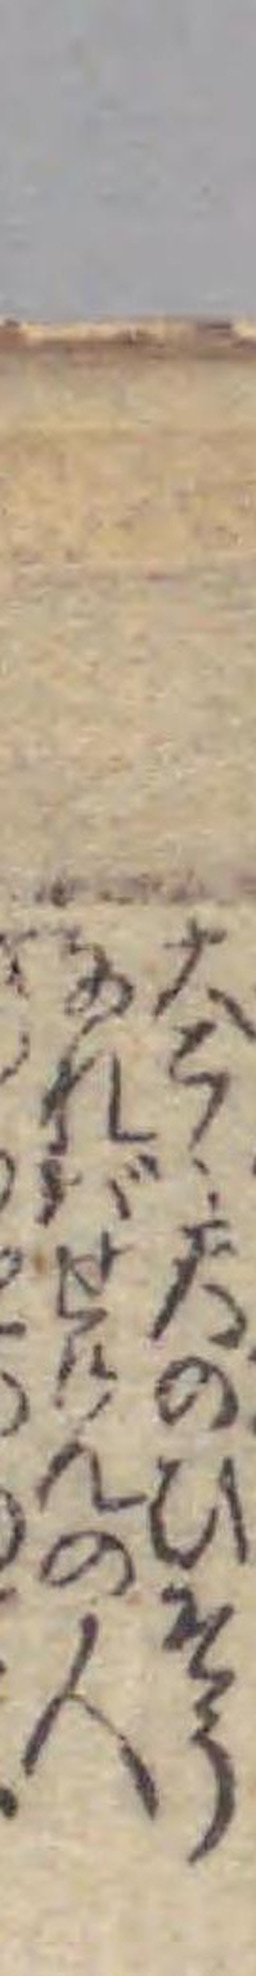なればせけんの人
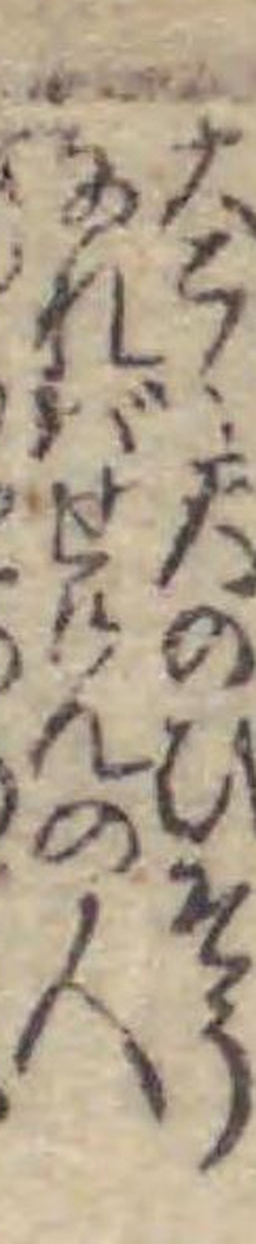なればせけんの人
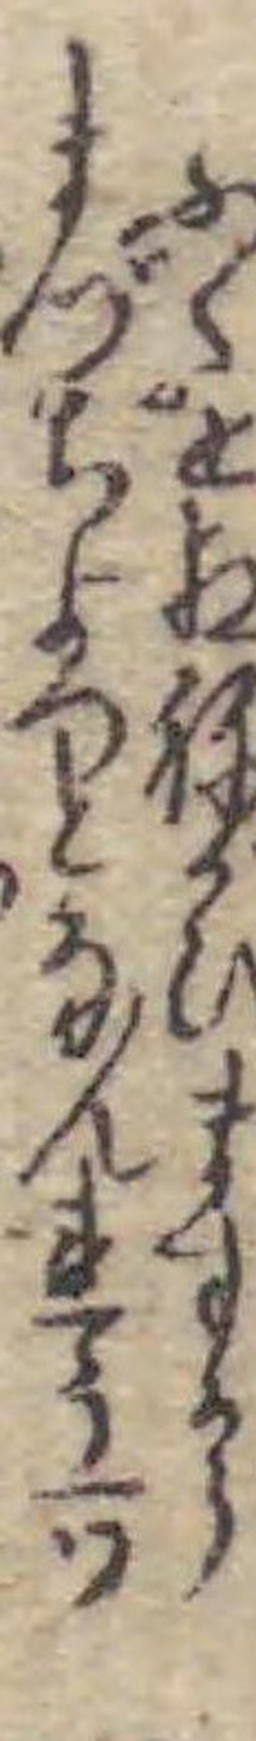まづちよつとなんれう一つ
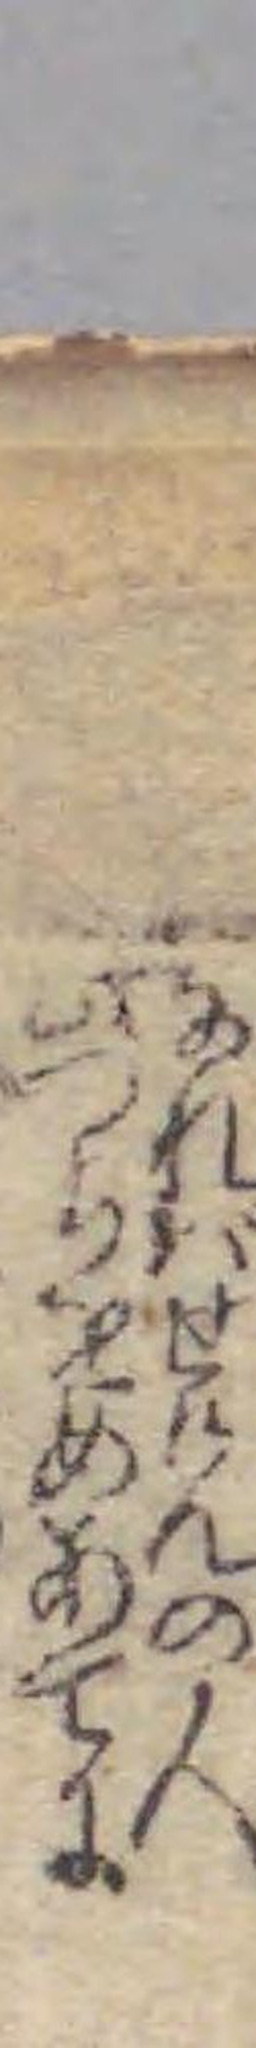此つちをめあてに
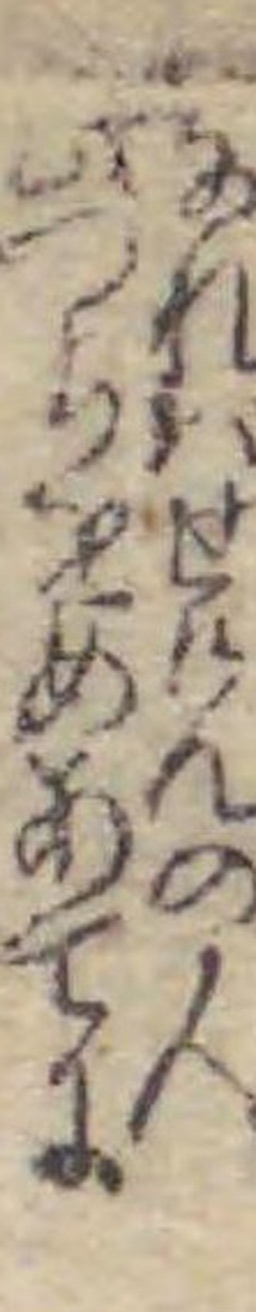此つちをめあてに
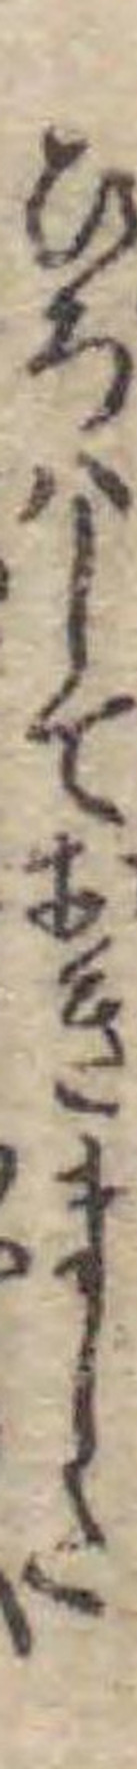ひろはしておきました
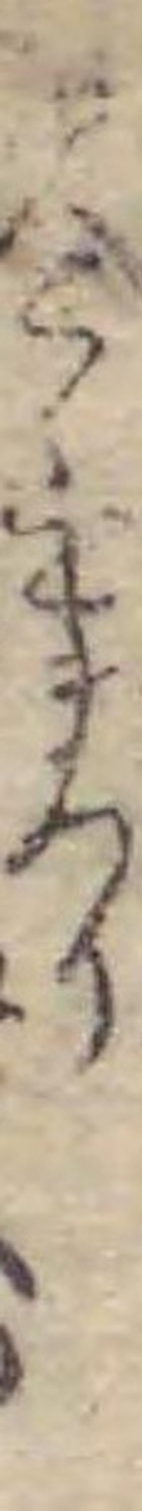大こくをまつり
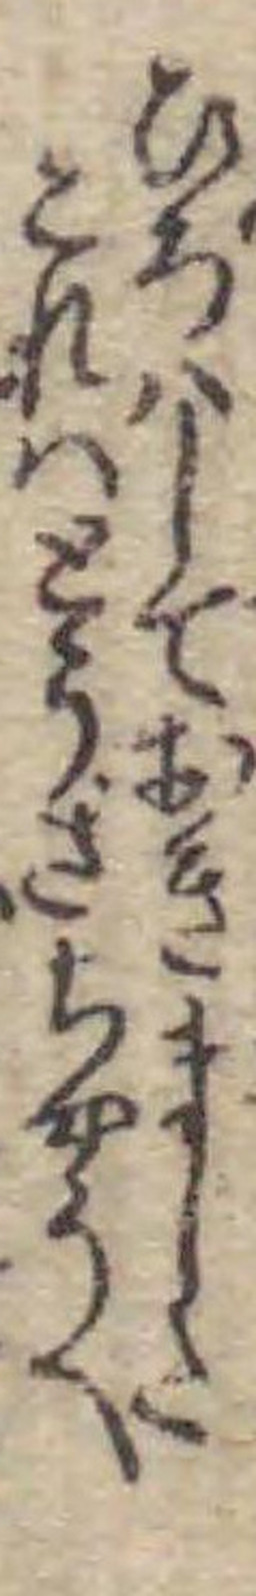これはとうざちやうへ
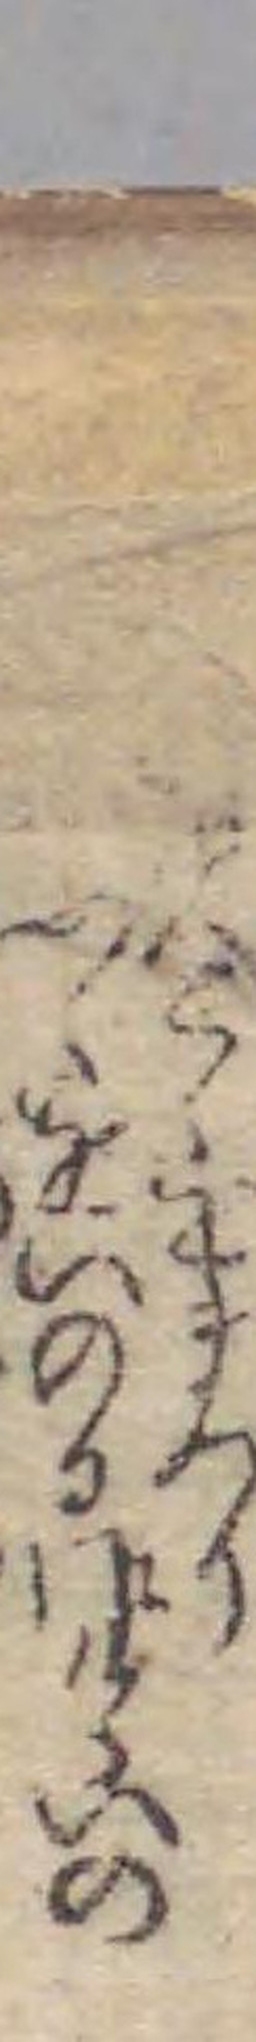ふくをいの御けらいの
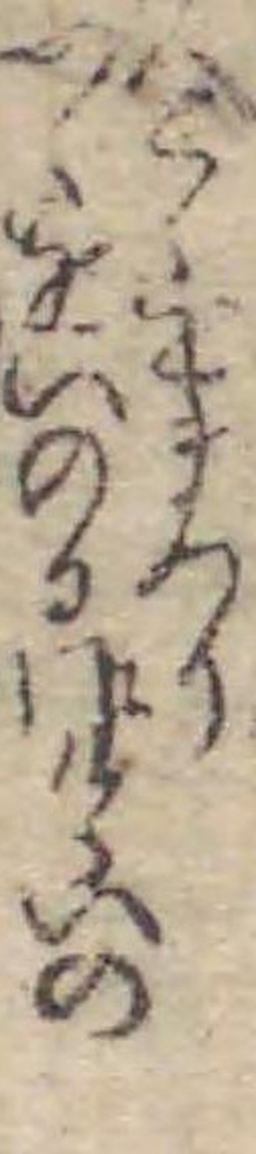ふくをいの御けらいの
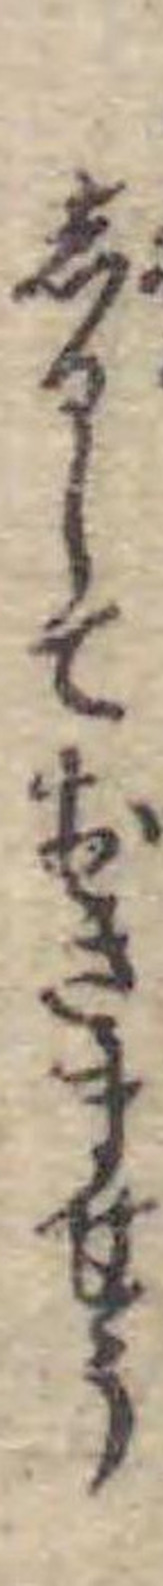しるしておきませう
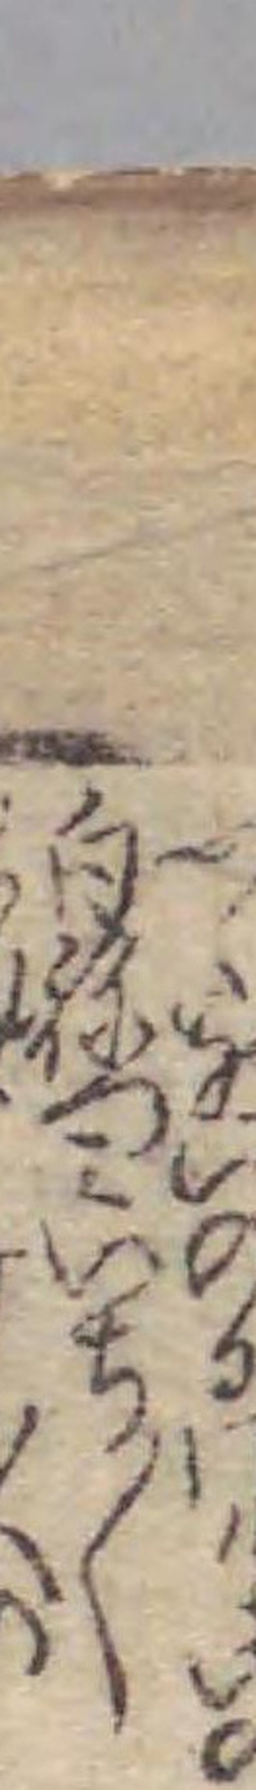白ねつみいち〳〵
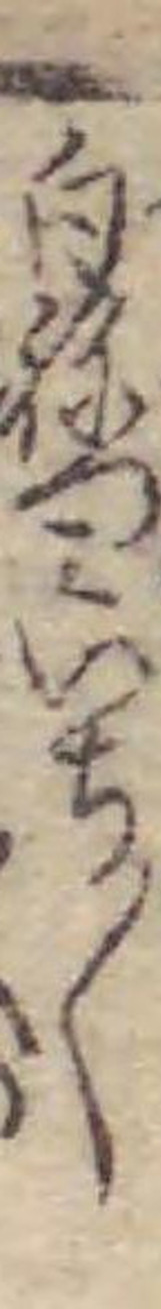白ねつみいち〳〵
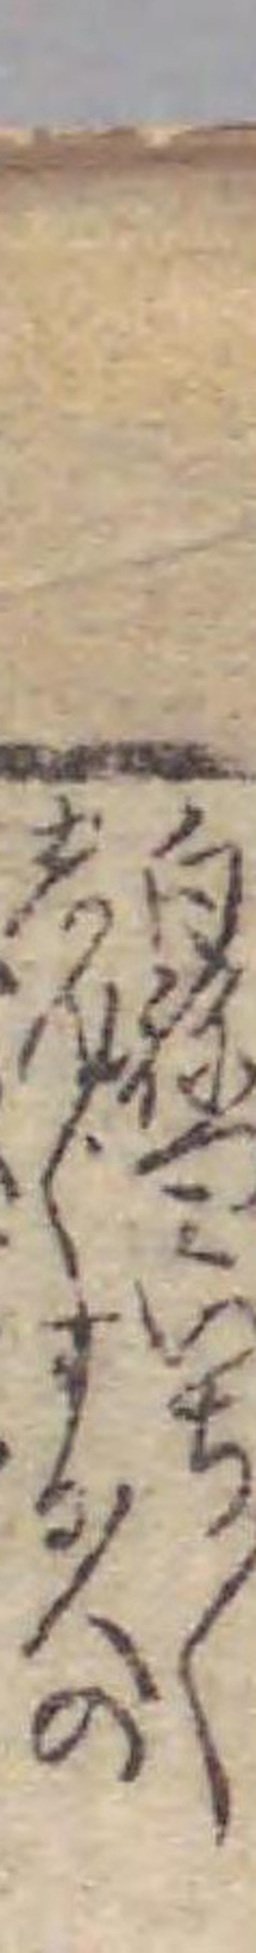しん〴〵する人の
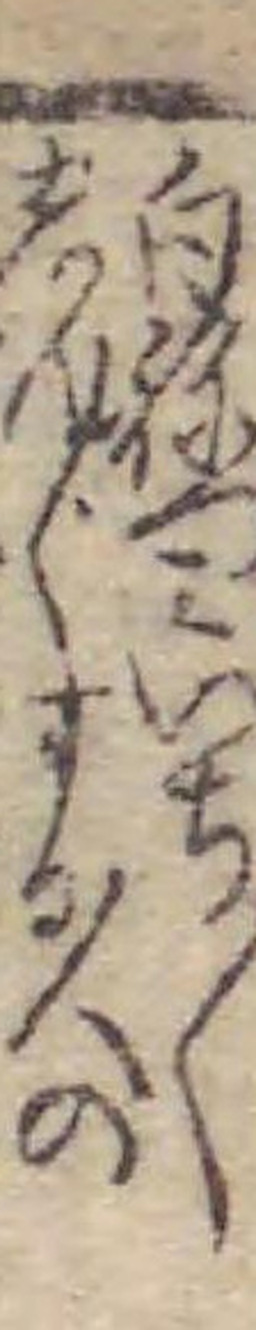しん〴〵する人の
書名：新鋳小判 : 3巻
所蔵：国立国会図書館 National Diet Library, JAPAN
